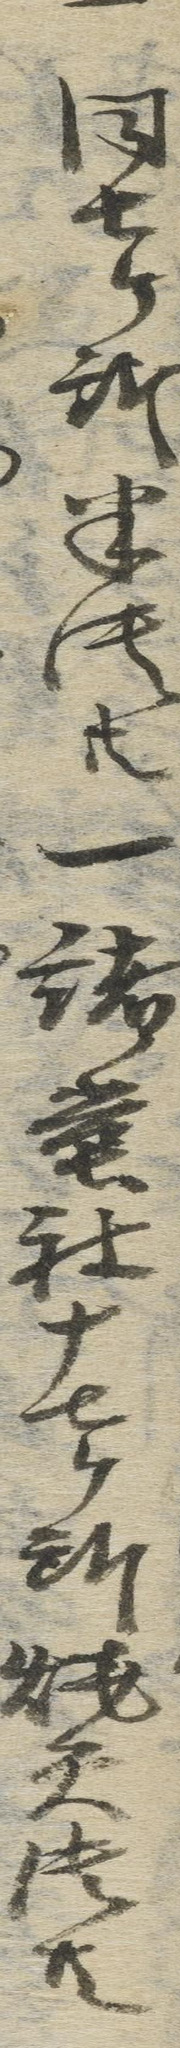一同七ヶ所半潰共一諸堂社十七ヶ所焼失潰共
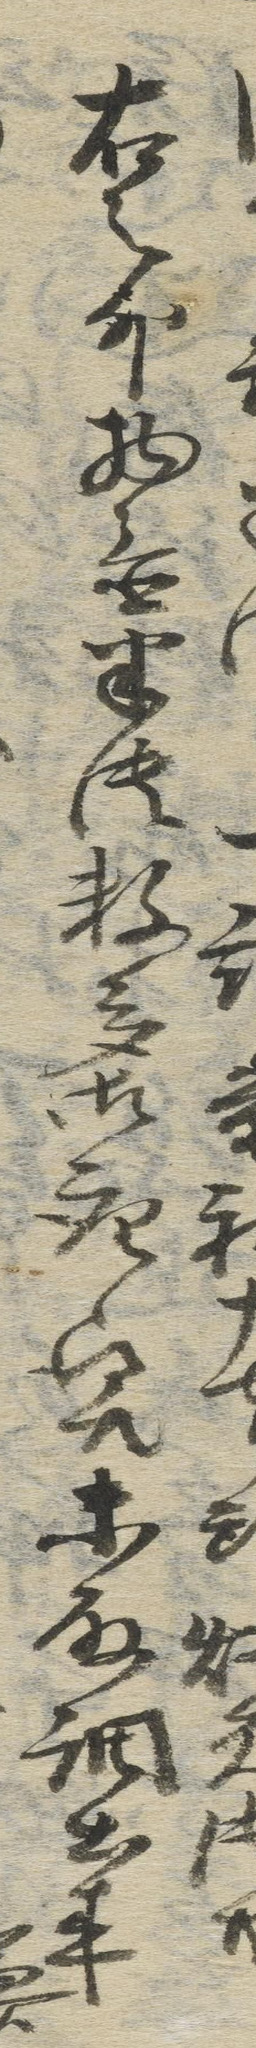右之外物置半潰数多御座候得共未取調出来兼候
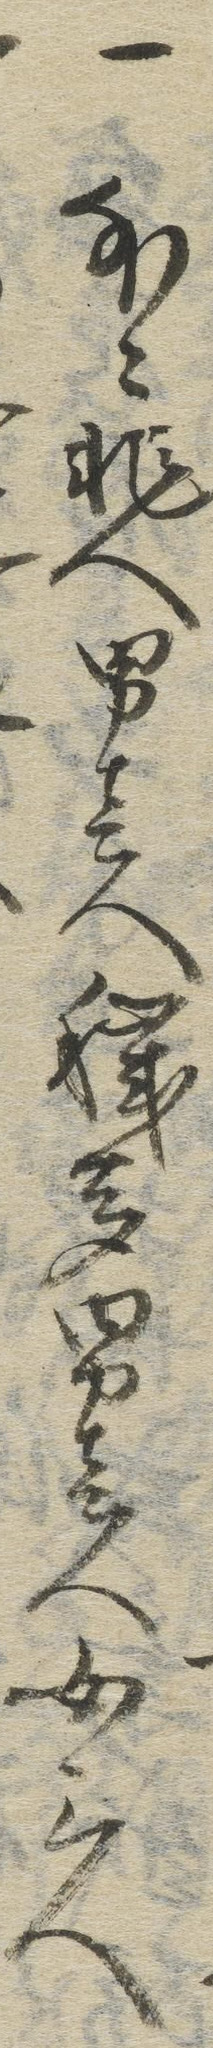一外二非人男壱人穢多男壱人女三人
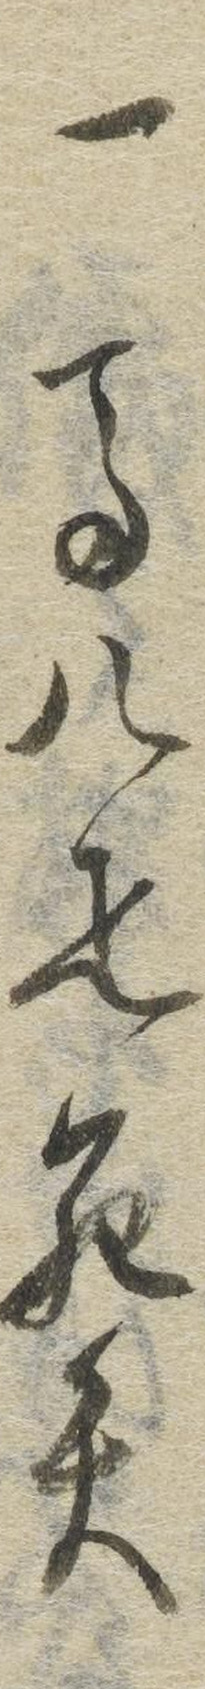一馬八疋死失
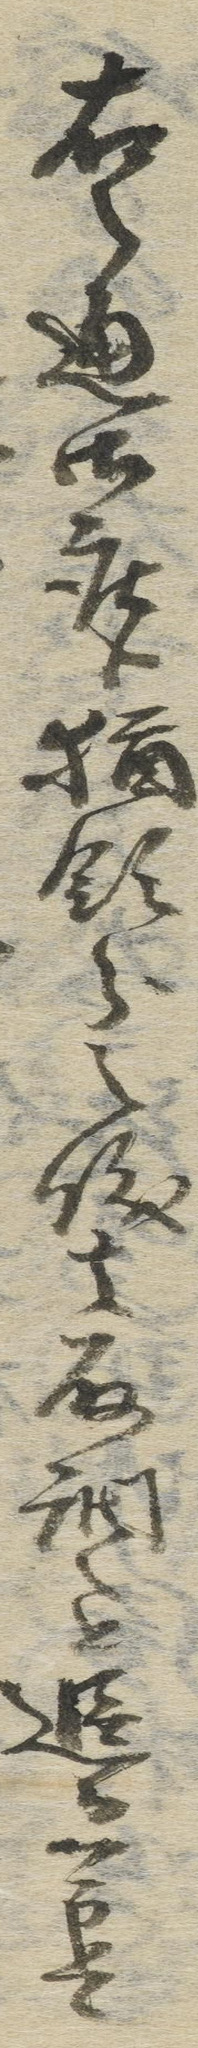右之通二御座候猶領分之儀は取調之上追而可申上候
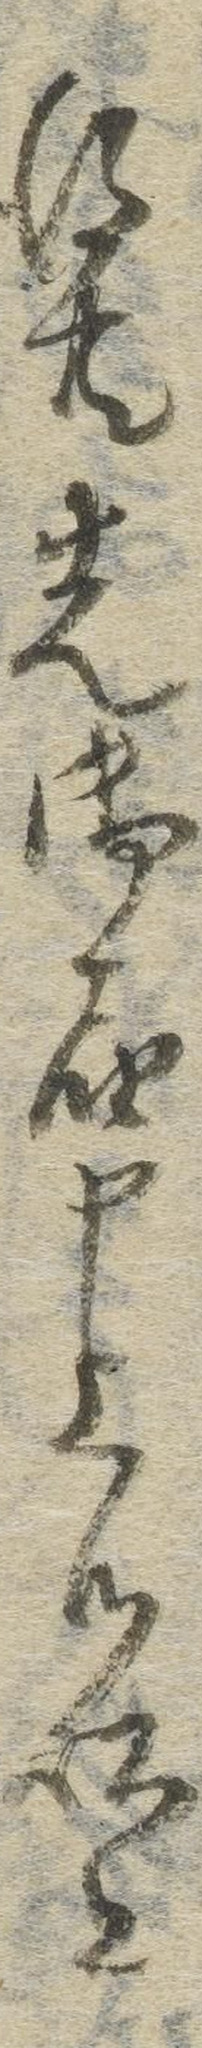得共先御届申上候以上
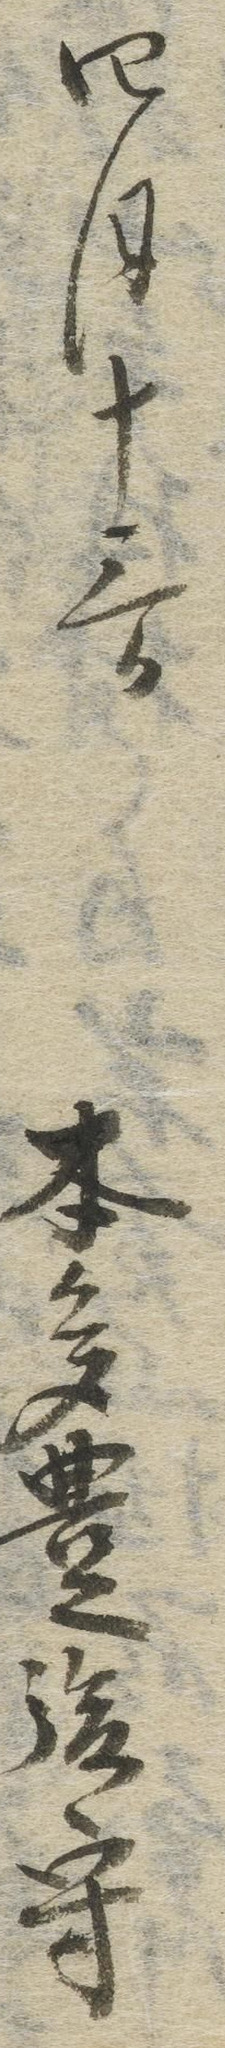四月十三日本多豊後守

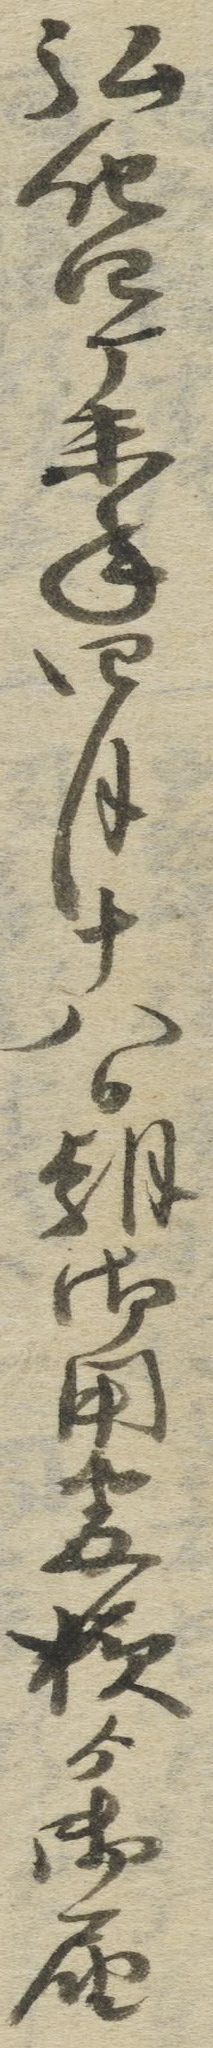弘化四丁未年四月十八日朝御用番様ゟ御届
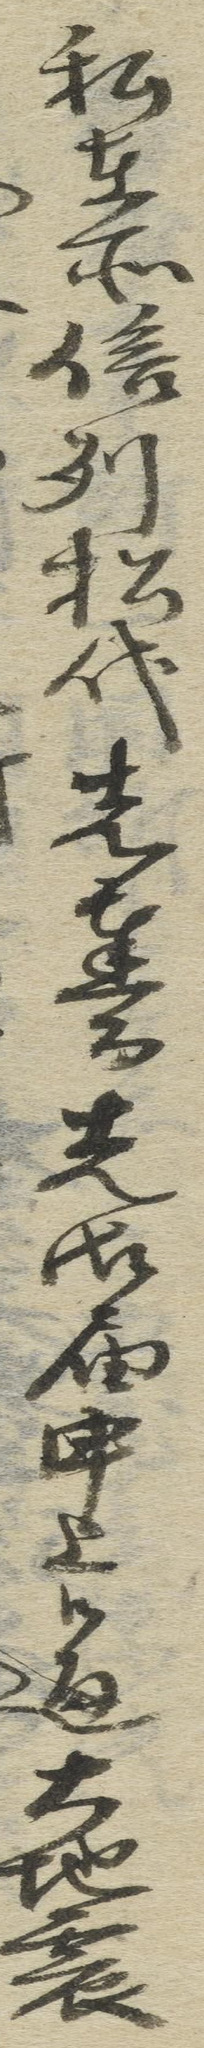私在所信州松代先達而先御届申上候通大地震
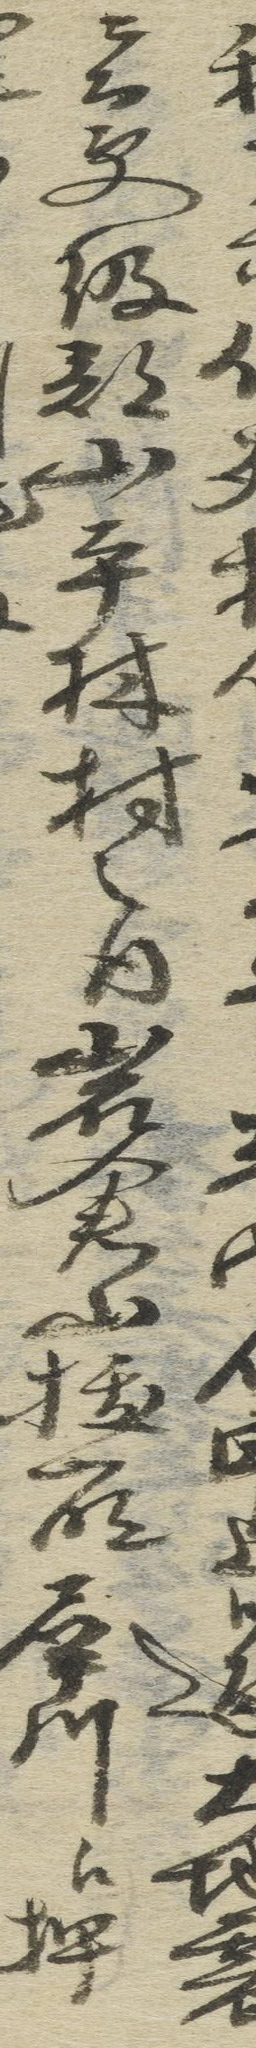二而更級郡山平林村之内岩倉山抜崩犀川江押
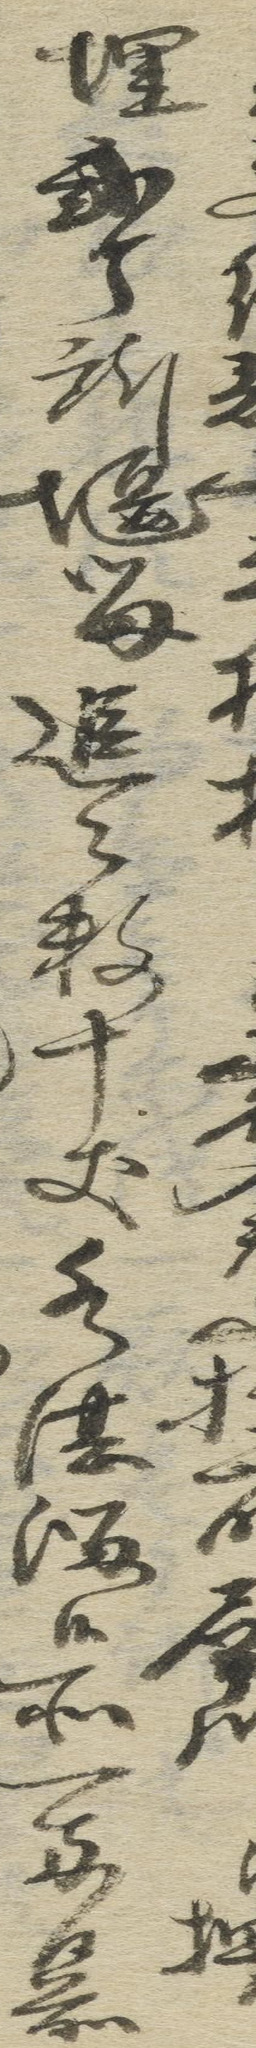埋弐ヶ所堰留追々数十丈水湛溜候所一両日前
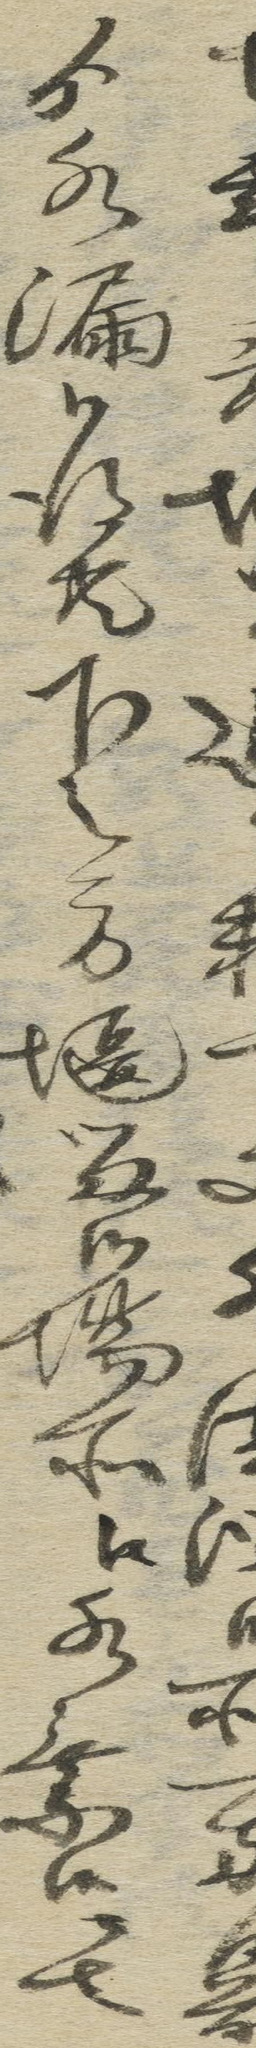ゟ水漏候得共下之方堰留候場所江水乗候二は
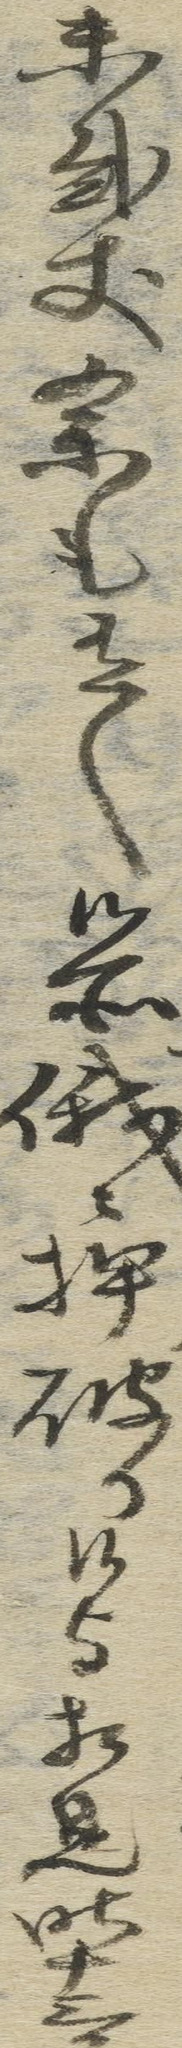未弐丈余も有之候所俄二押破り候と相見昨十三日
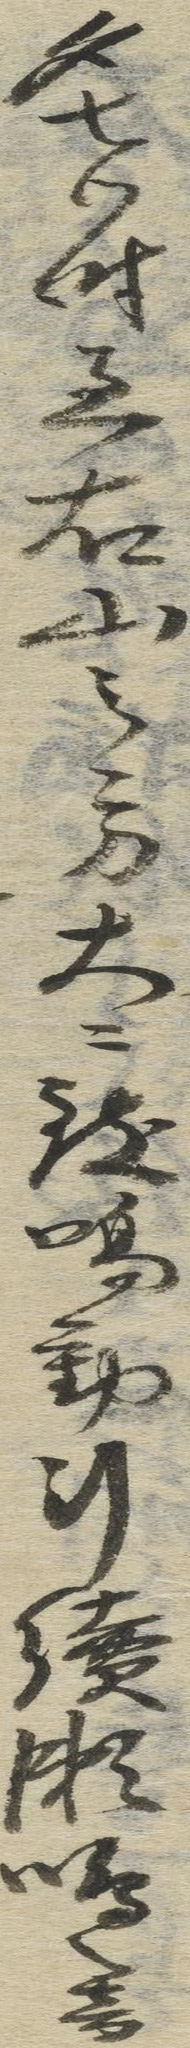夕七ツ時過右山之方大二致鳴動引続瀬鳴之音
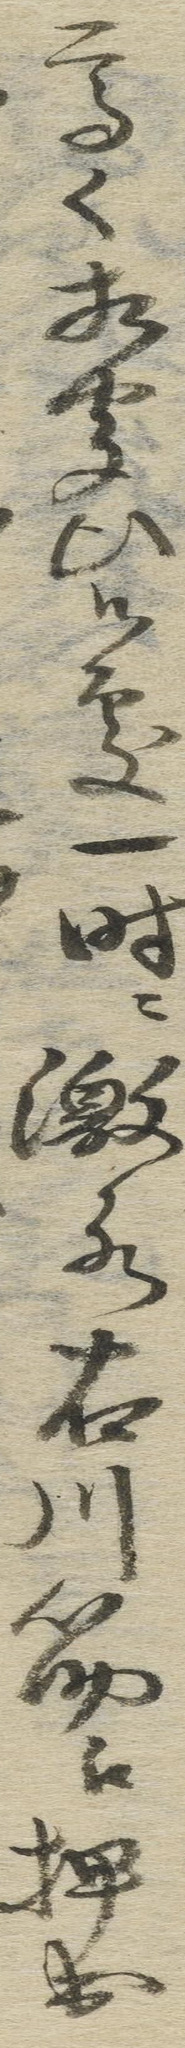高く相聞ひ候処一時二激水右川筋江押出
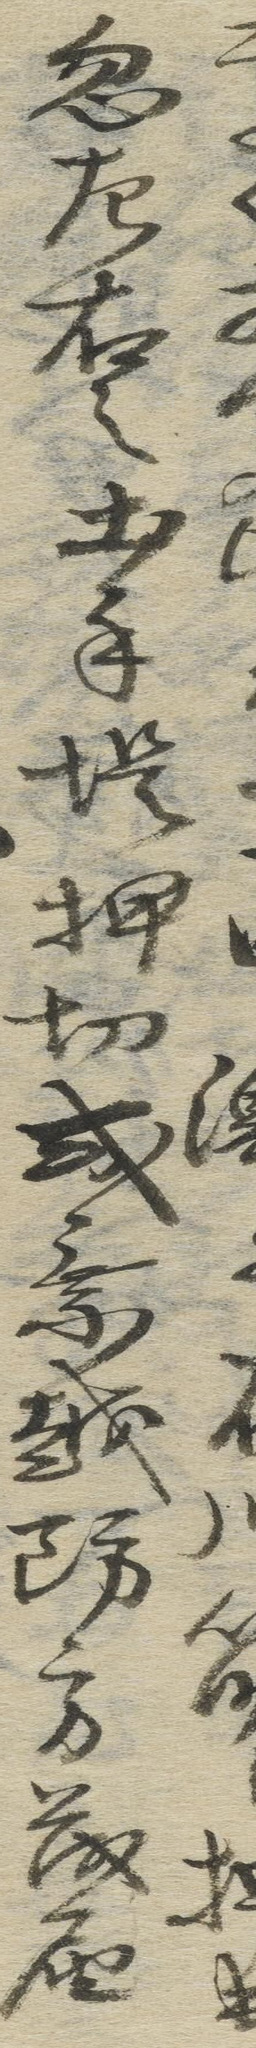忽左右之土手堤押切或乗越防方も届
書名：信濃越後　地震書留
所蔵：東京大学地震研究所図書室 Earthquake Research Institute Library, The University of Tokyo, JAPAN
